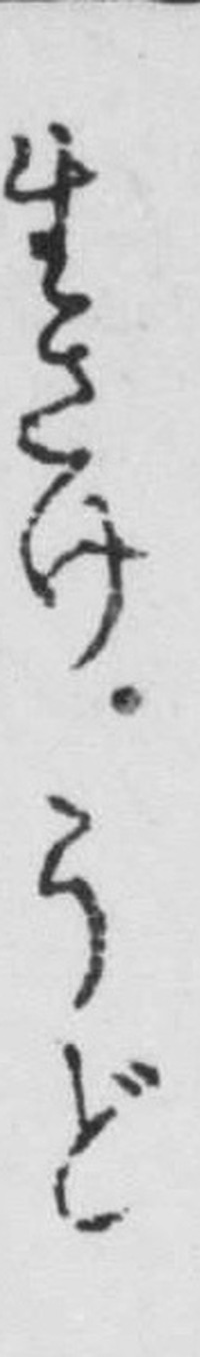生さけうど
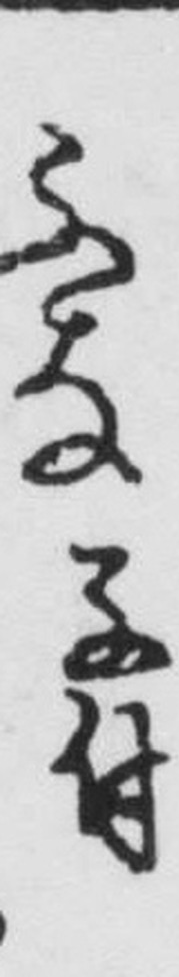ふな子付
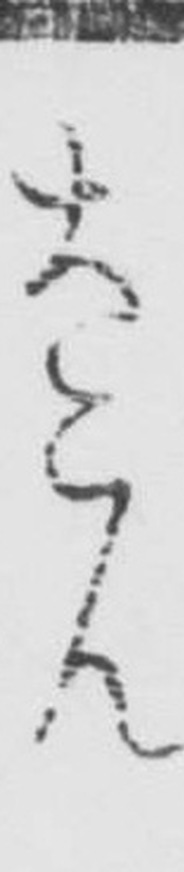大こん
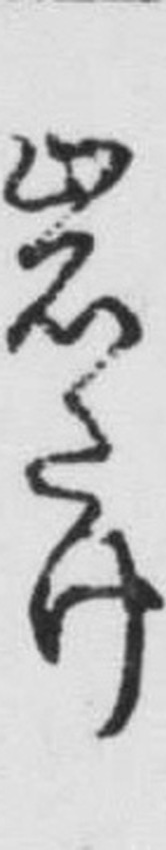岩たけ
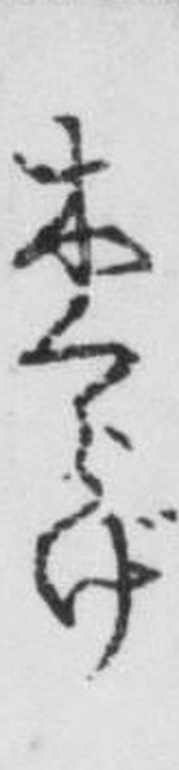木くらげ
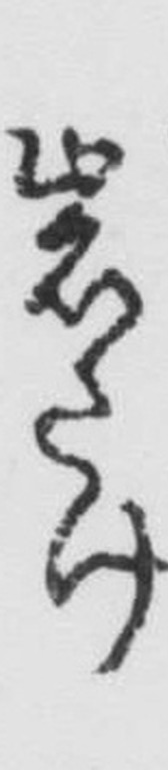岩たけ
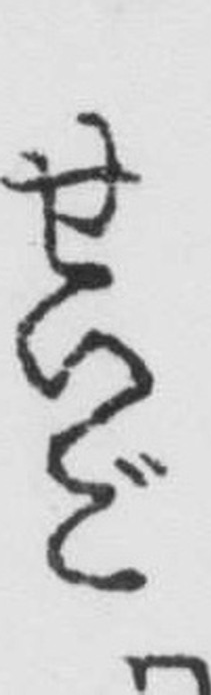せいご
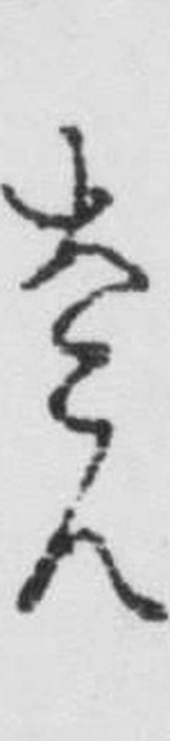大こん
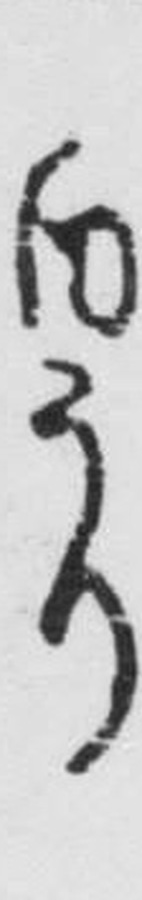尻うり
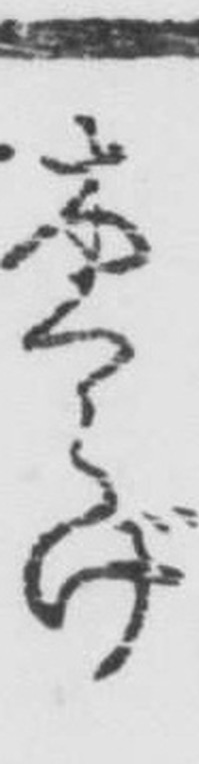木くらげ
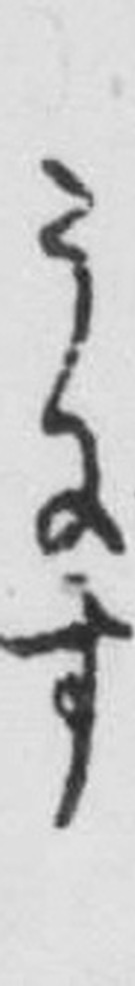うにす
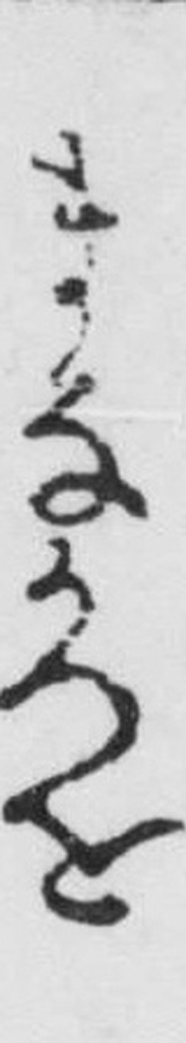まなかつを
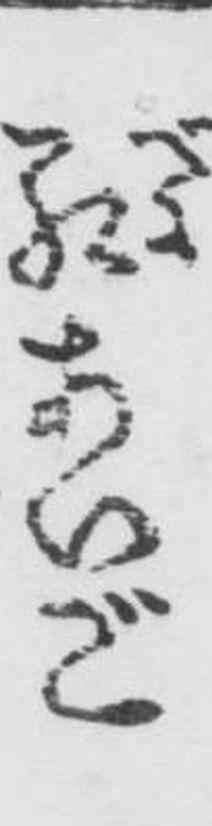紅あいご
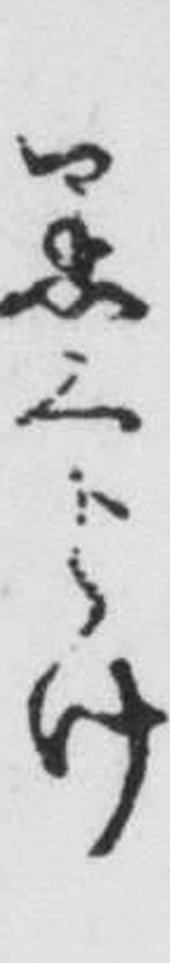黒くらけ
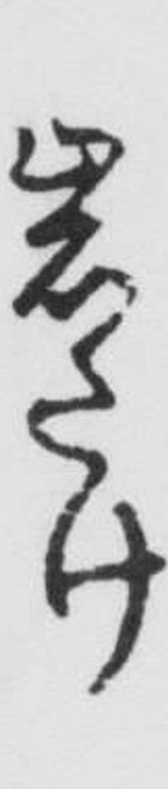岩たけ
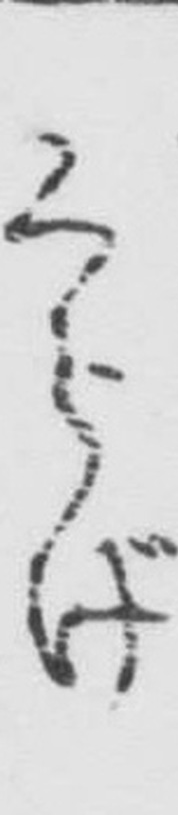くらげ
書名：諸家通用/即席料理
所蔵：大阪府立大学学術情報センター 国文学研究資料館
